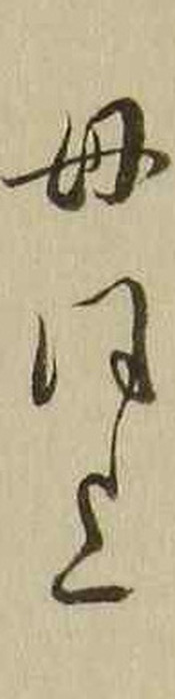母同上
